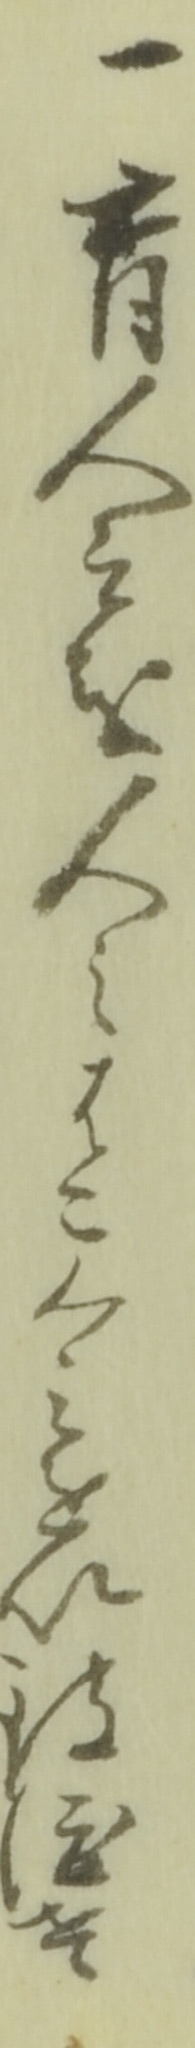一盲人之義人之はこくみを以在致渡世候
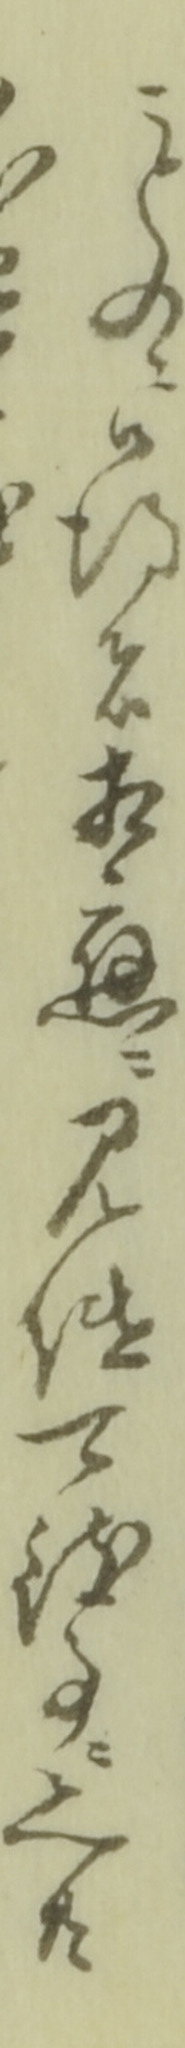ものに候得は相応二見継可致事ニ候へ共
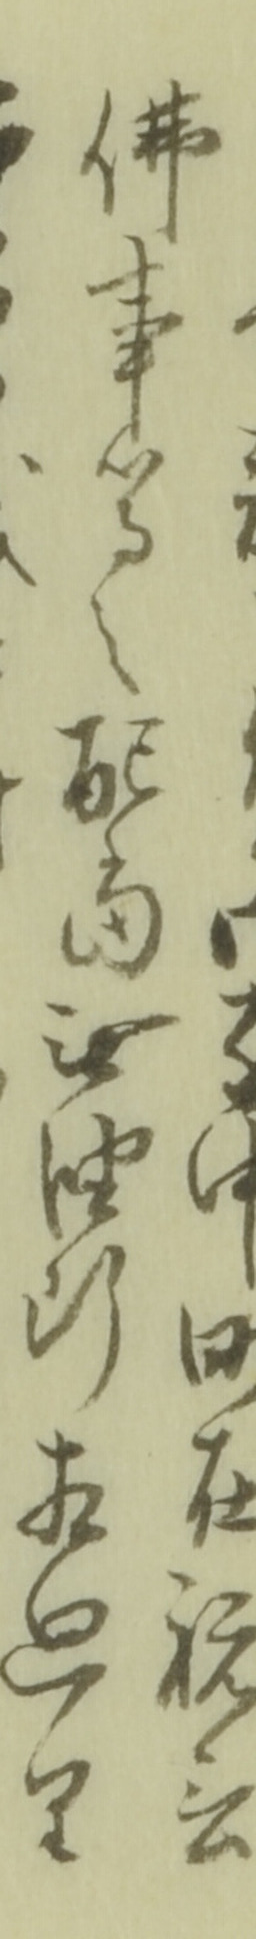仏事等之配当無油断相廻り
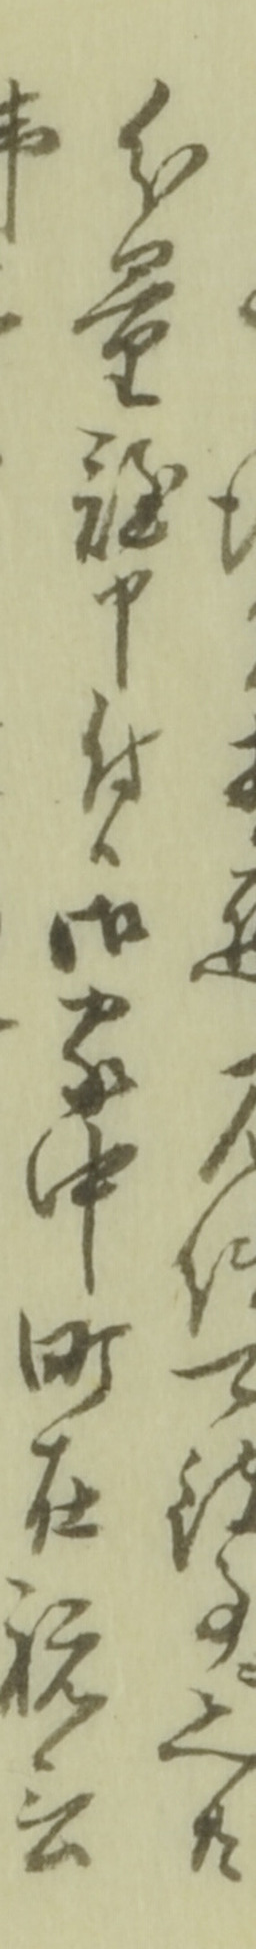分量難申付候御家中町在祝言
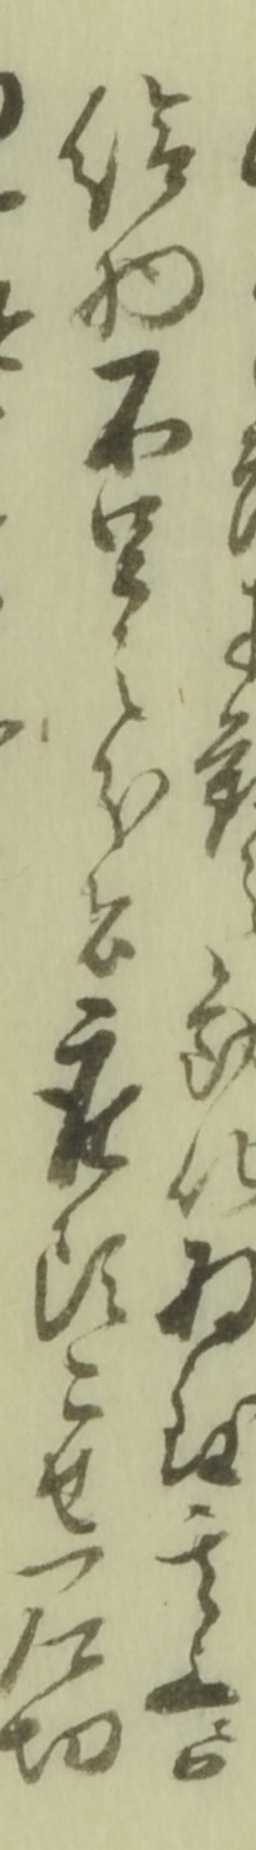給物不足之分者座頭こせ一郷切
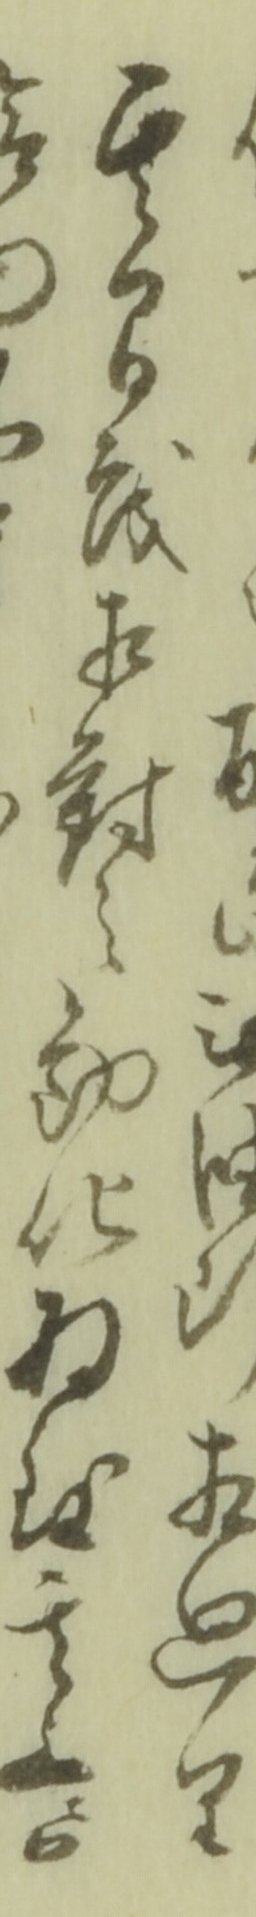其間茂相対之勧化為致其上ニ而
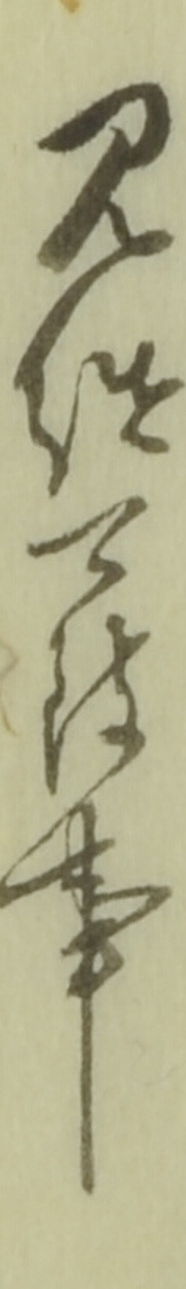見継可致事
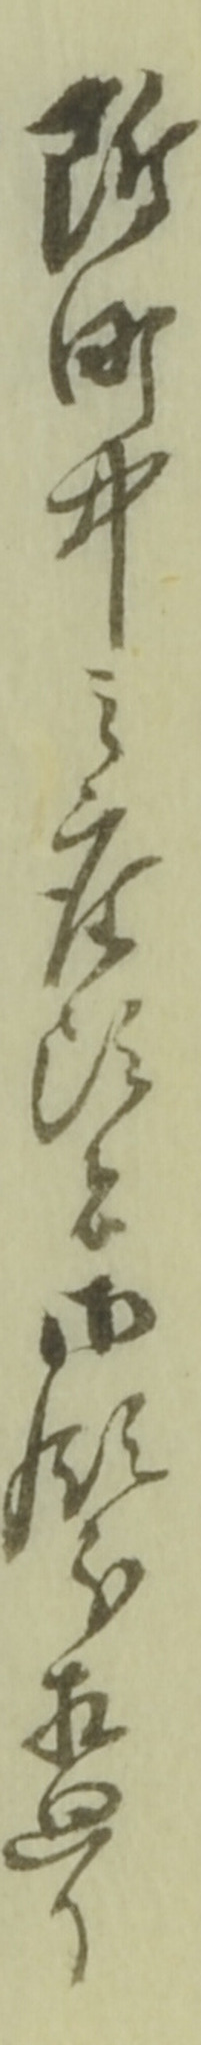附町中之座頭者御領分相廻り
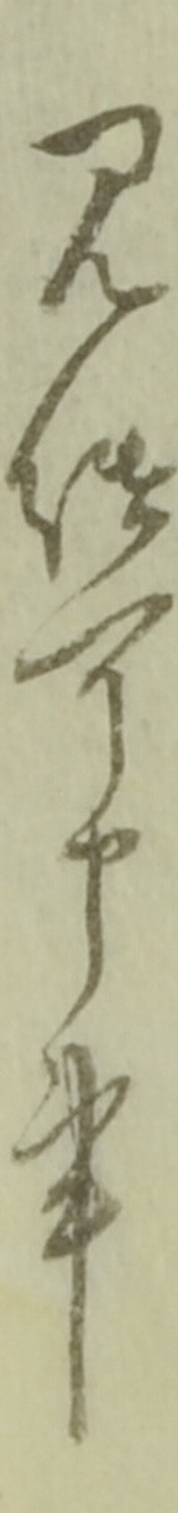見継可申事
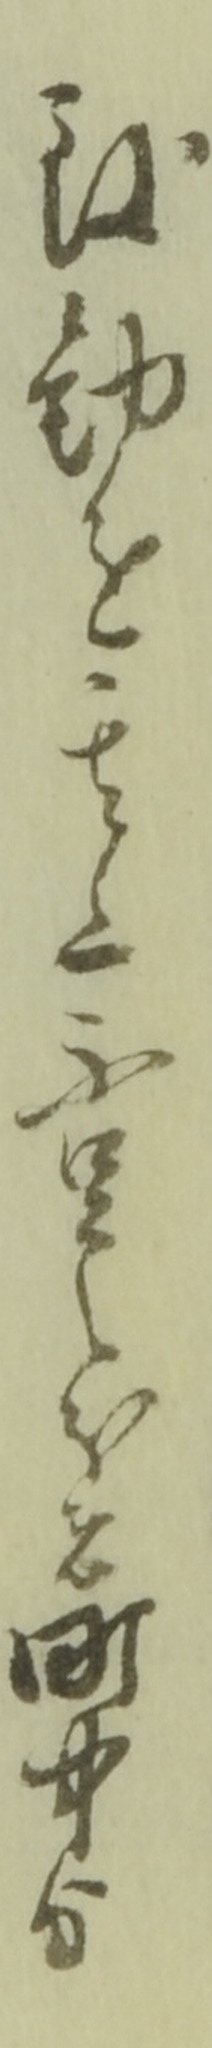致勧進其上不足之分者町中ゟ

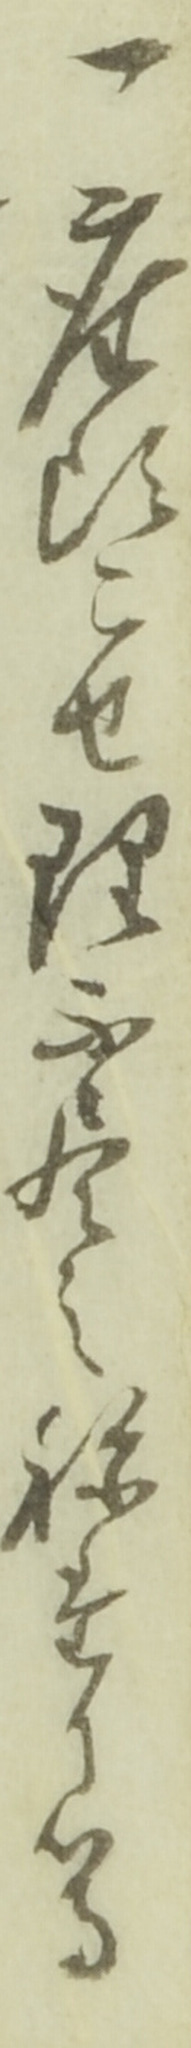一座頭こせ理不尽之ねたり等
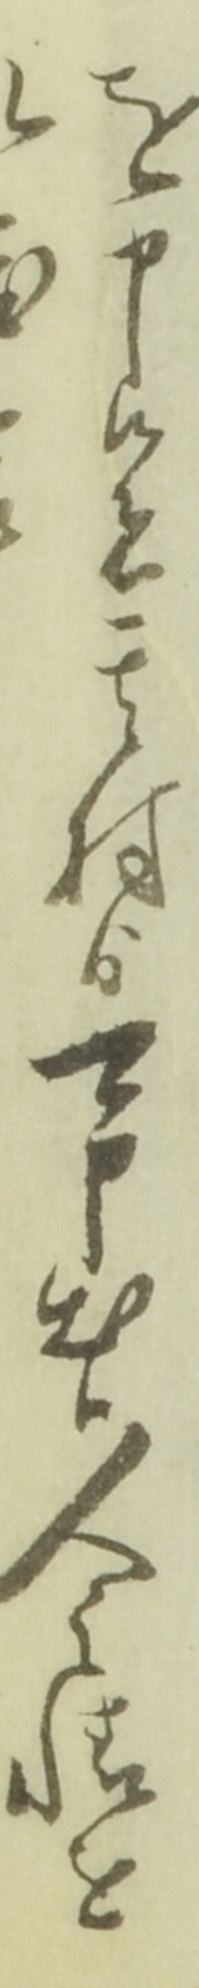を申候者其村ゟ可申出候人之情を
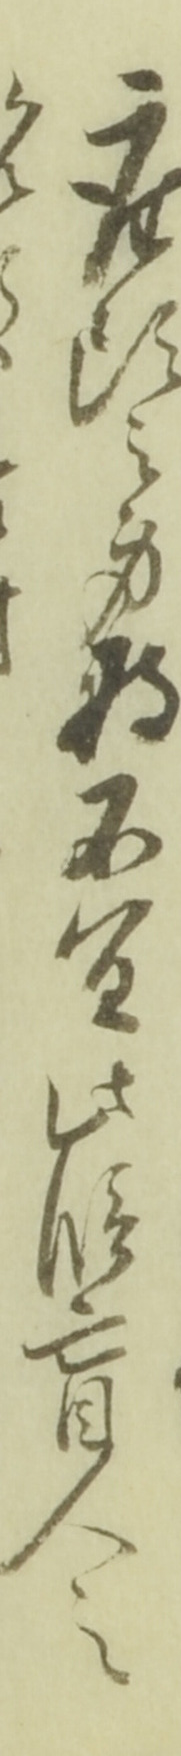座頭之身持不宜此段盲人之
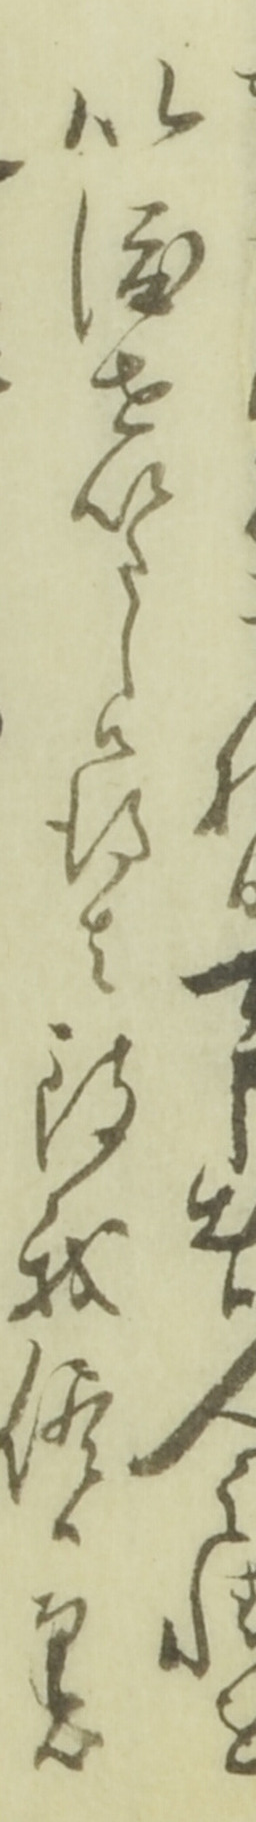以渡世いたし候得者致我侭候而者
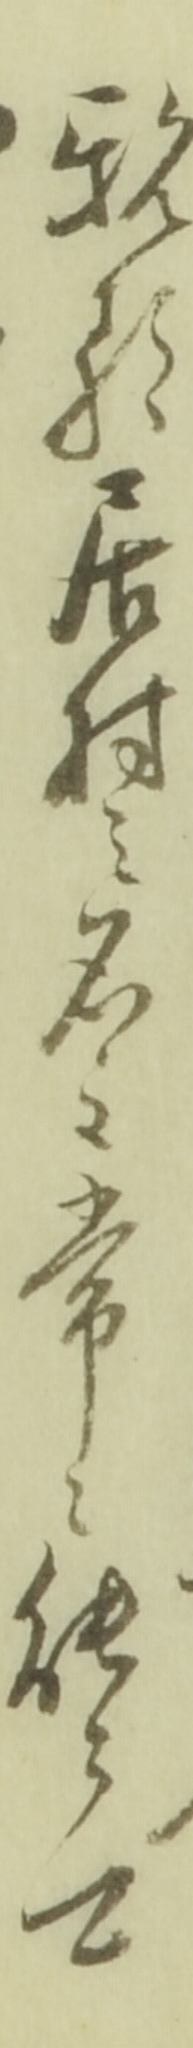親類居村之名主常々能々可
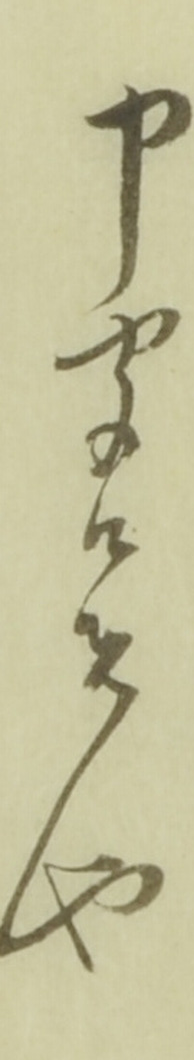申聞候者也
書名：御公儀様御領主様御触書控
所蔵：伊那市立高遠町図書館・合同会社AMANE
